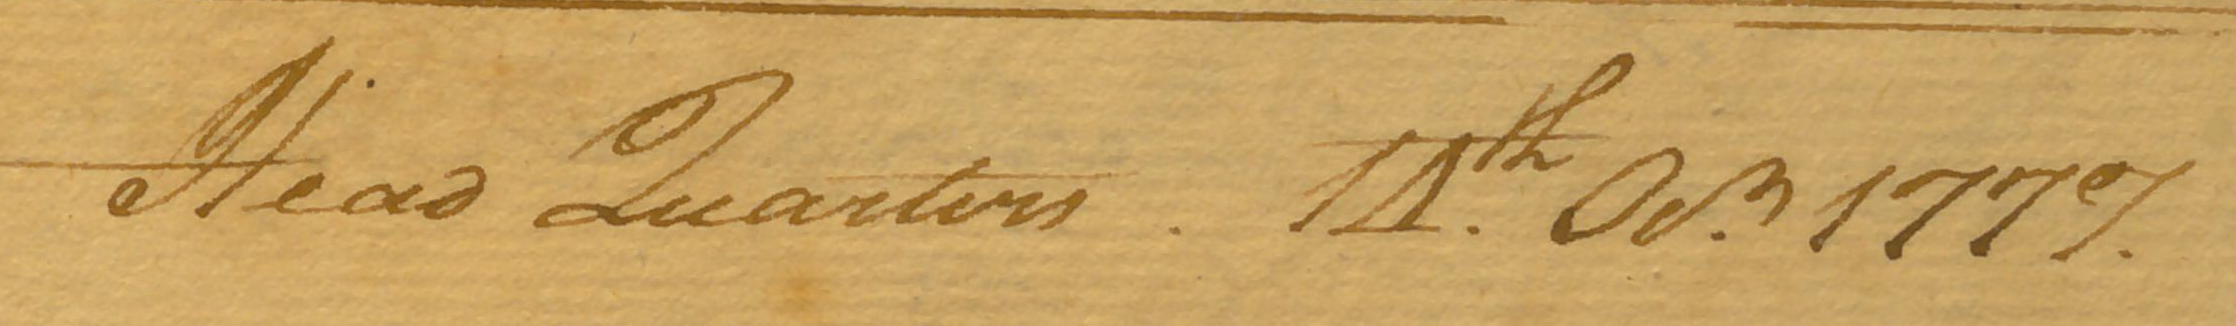Head Quarters. 11^th Oc^r. 1777.
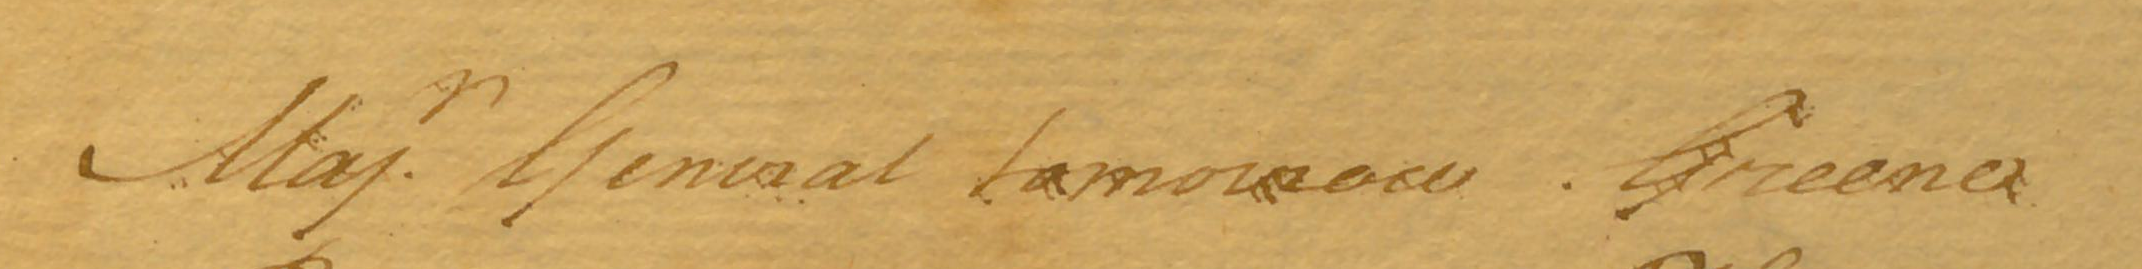Maj^r. General tomorrow. Greene
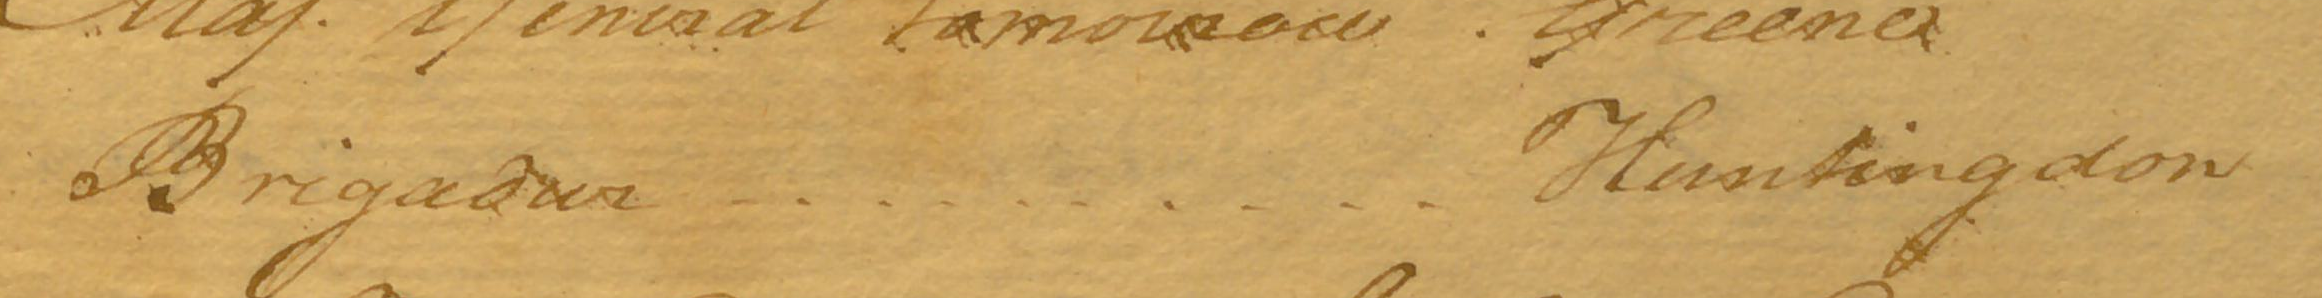Brigadier ......... Huntingdon
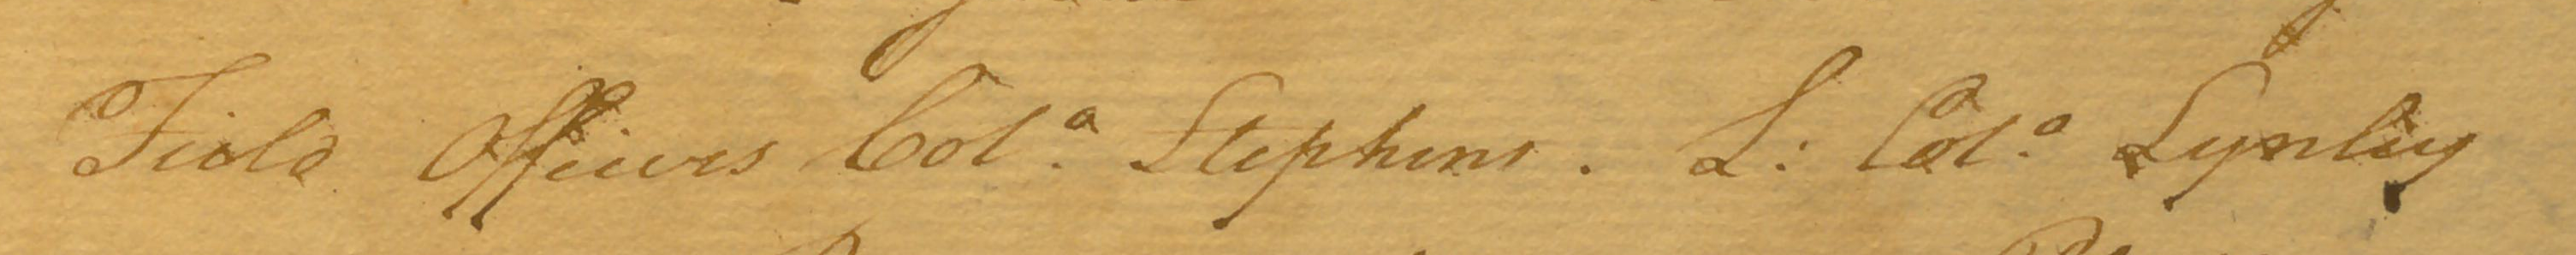Field Officers Col^o. Stephens. L: Col^o. Lynley
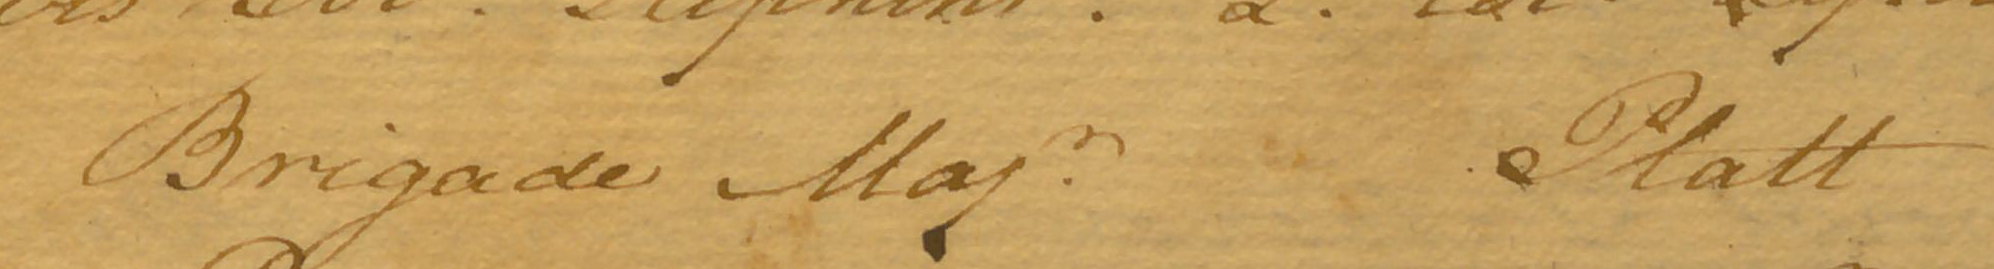Brigade Maj^r. Platt
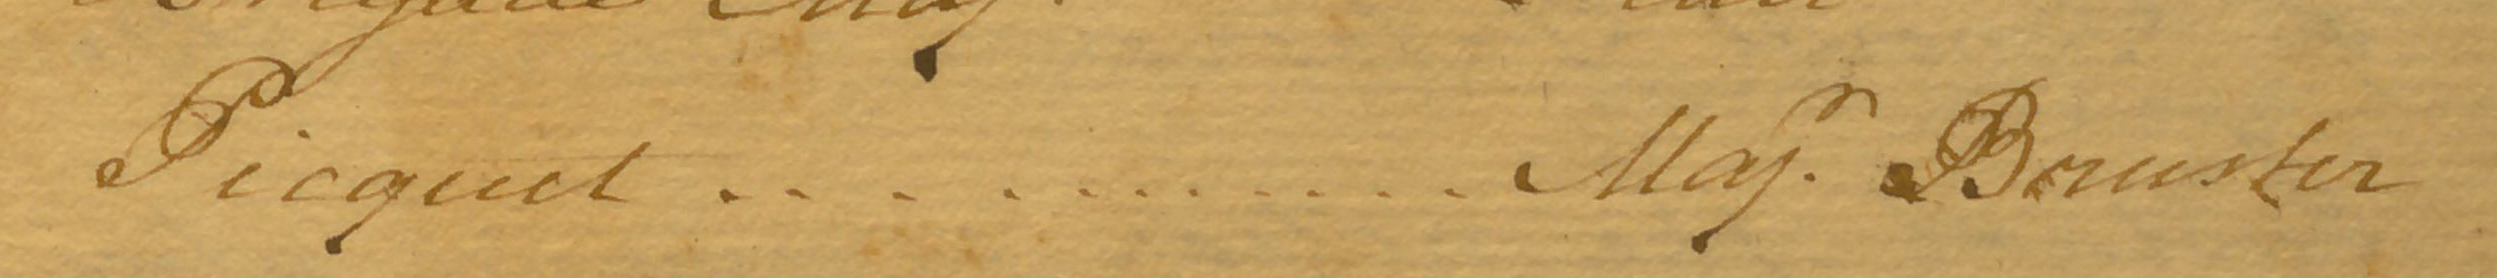Picquet ........... Maj^r. Bruster
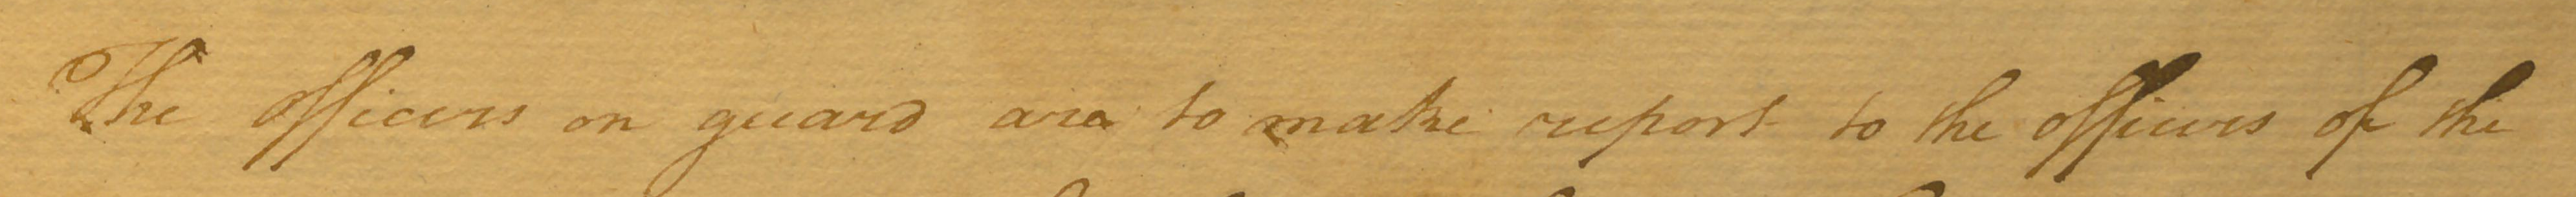The officers on guard are to make report to the officers of the
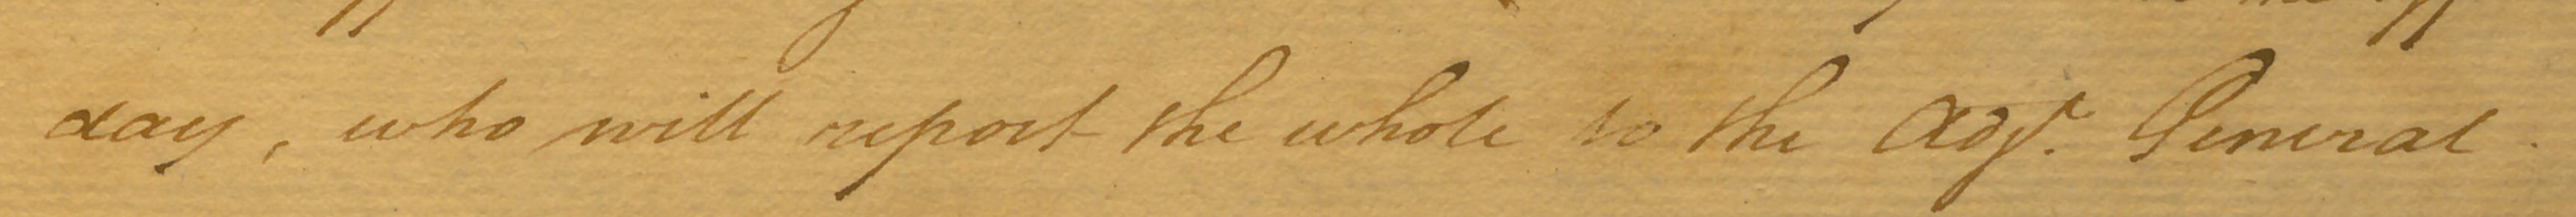day, who will report the whole to the Adj^t. General
